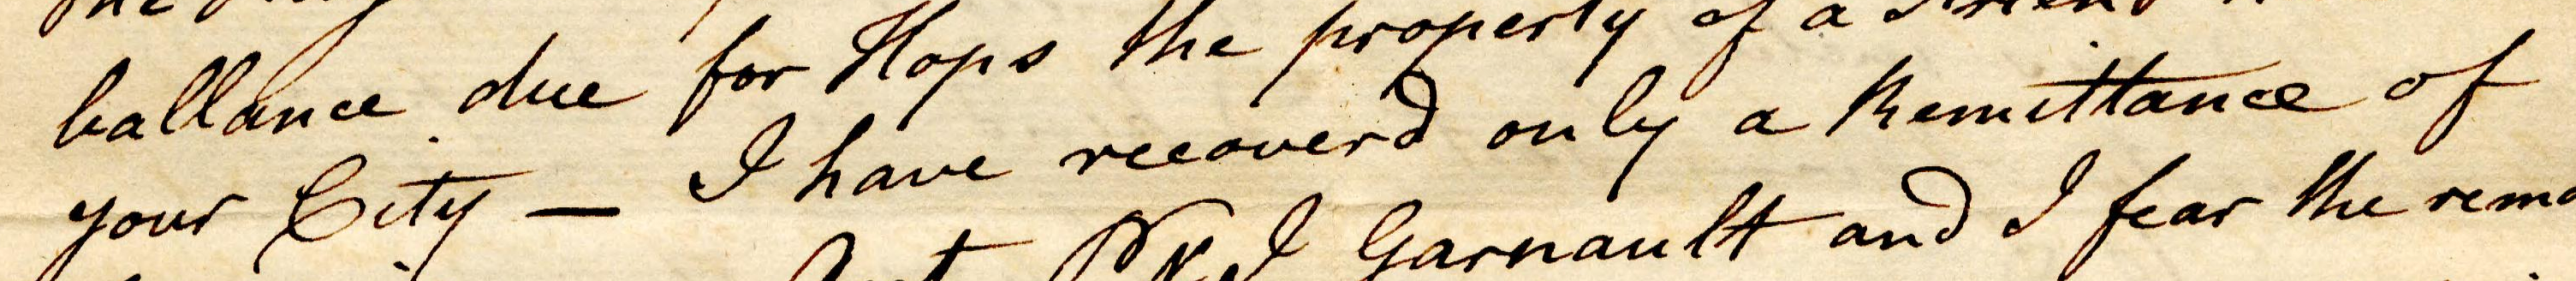your City- I have recovered only a Remittance of
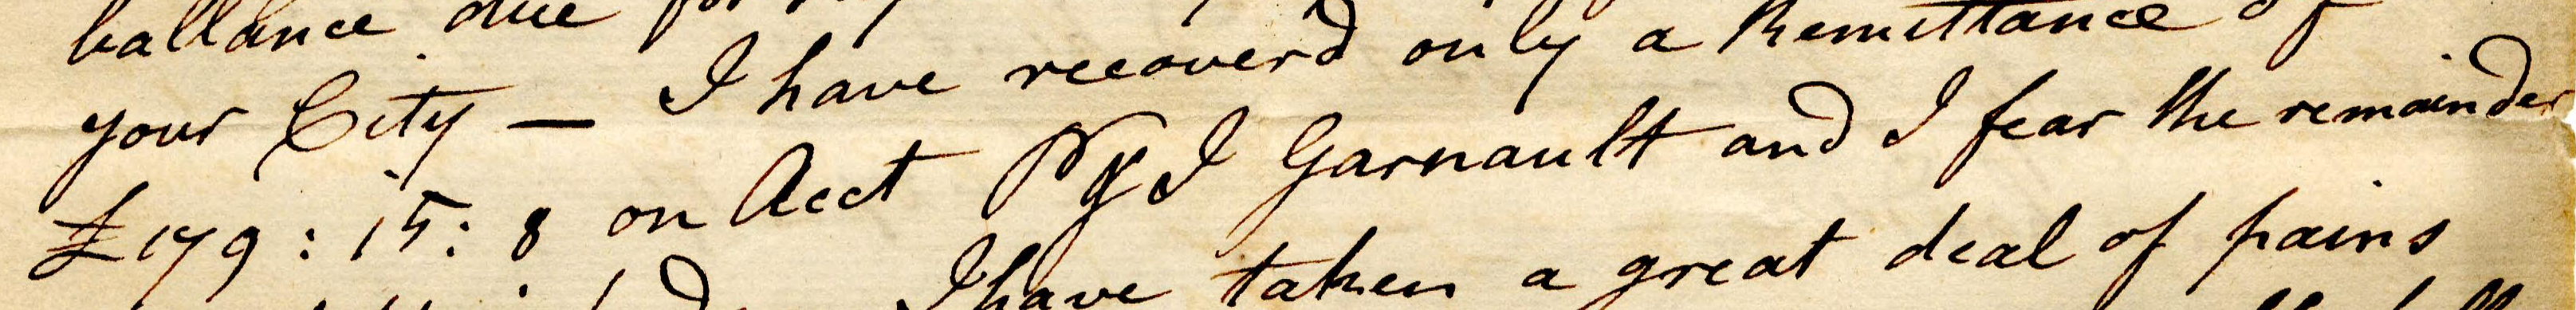£179: 15: 8 on Acct Per J Garnault and I fear the remainder
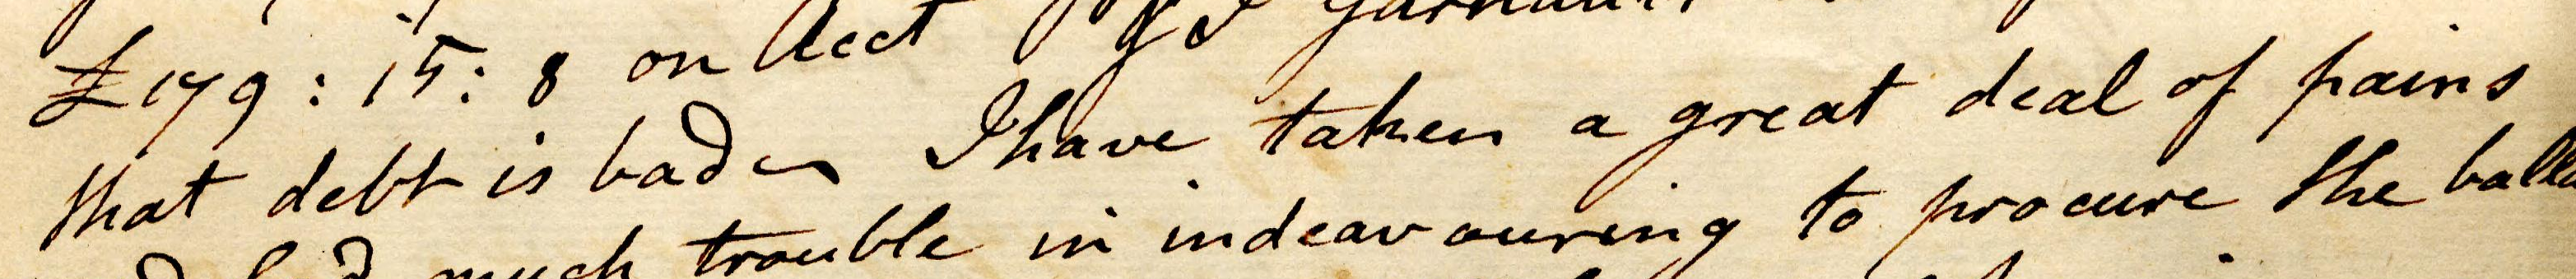that debt is bad. I have taken a great deal of pains
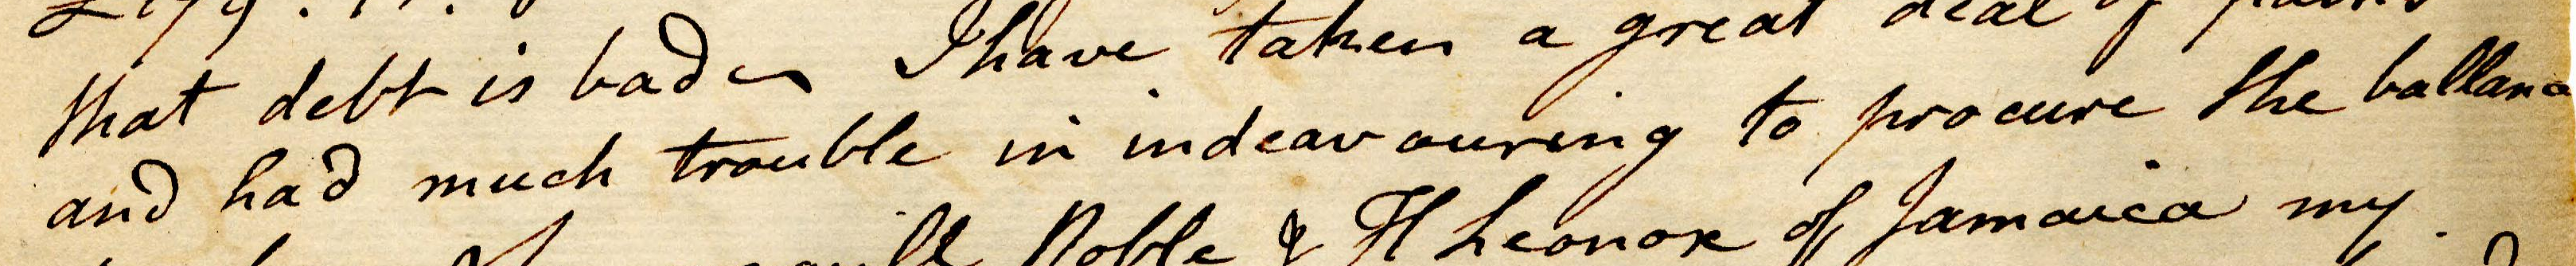and had much trouble in indeavouring to procure the ballance
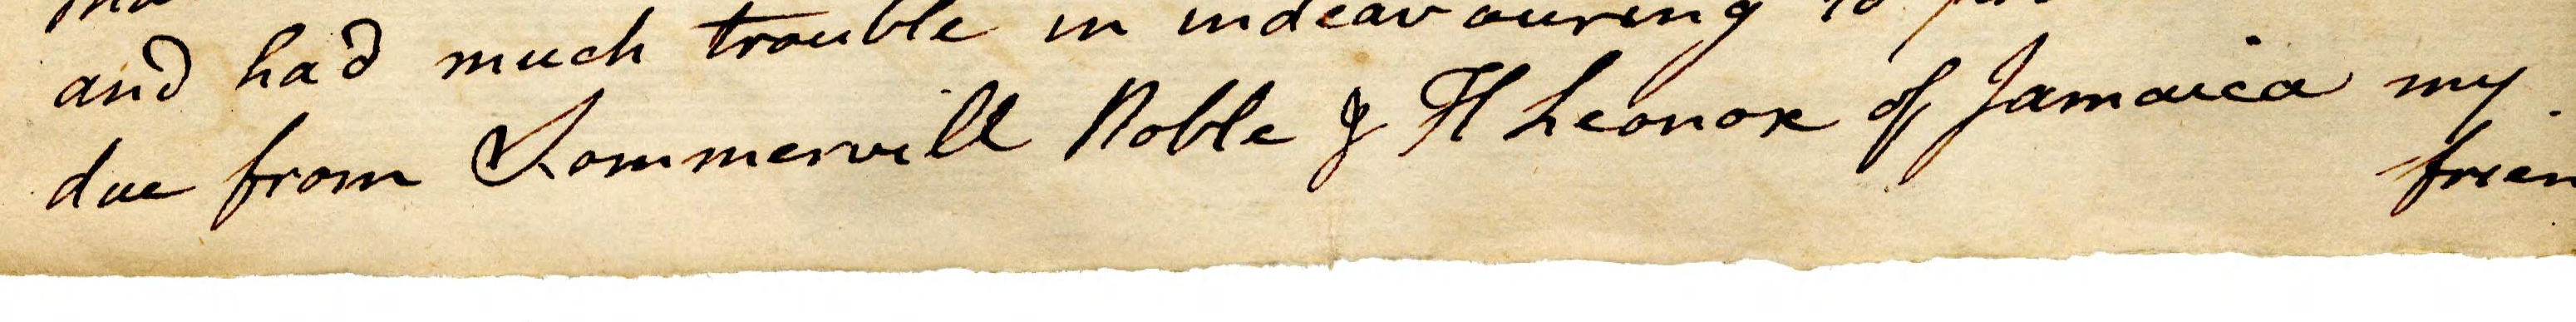due from Sommervill Noble & H Lennox of Jamaica my
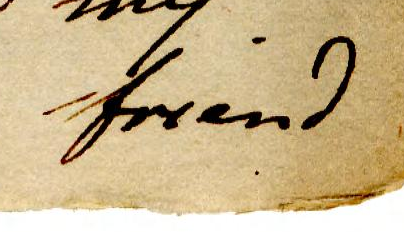friend
